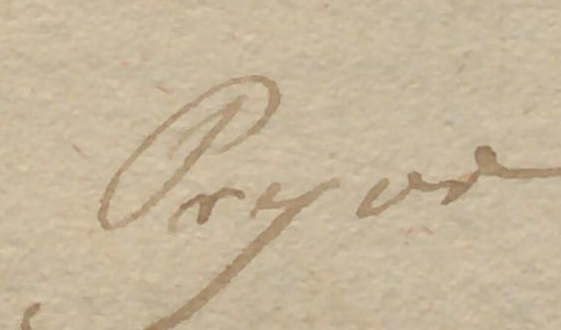Pryor
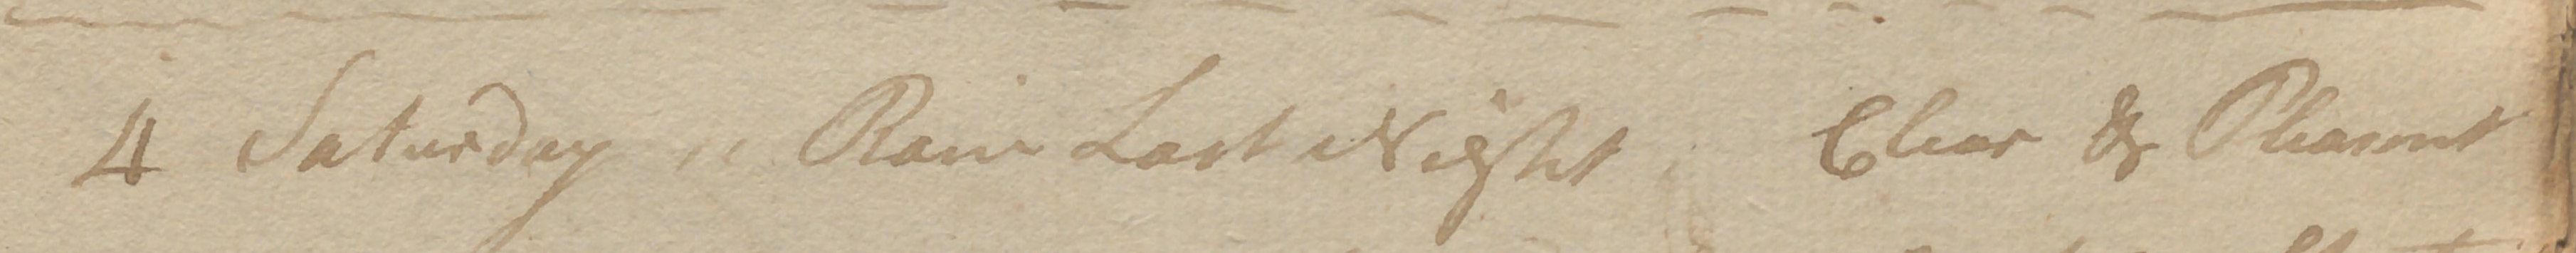4 Saturday, Rain Last Night, Clear & Pleasent
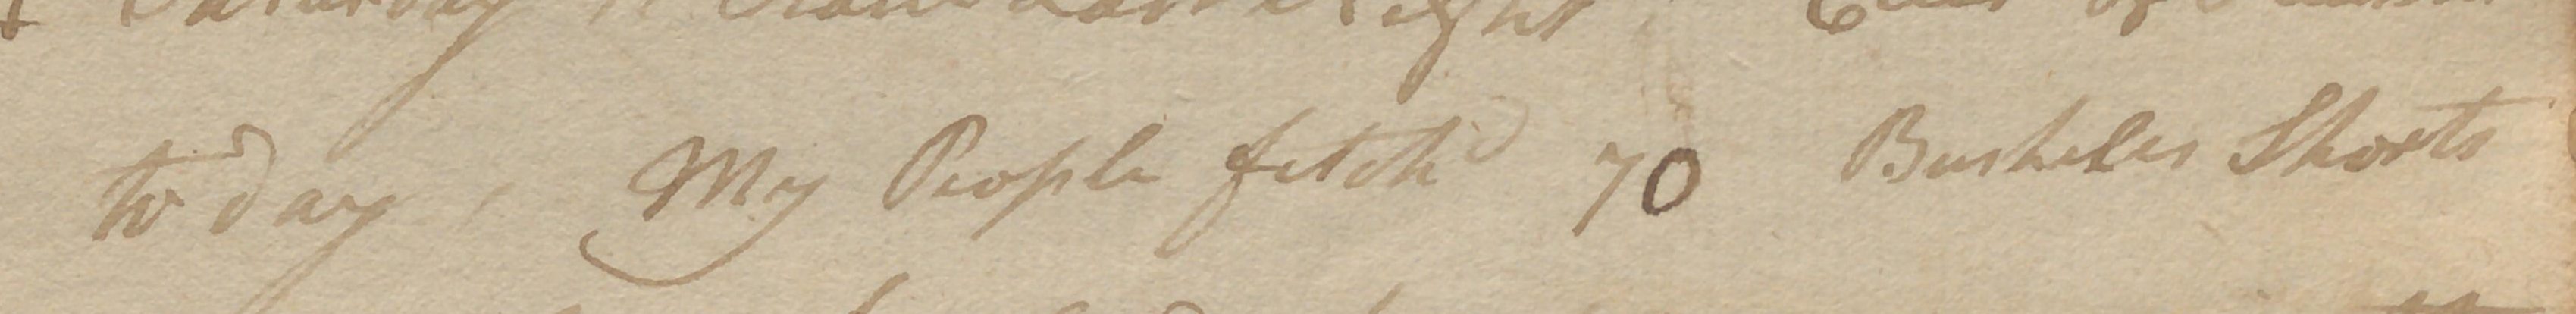today My People fetch 70 Bushills Shorts
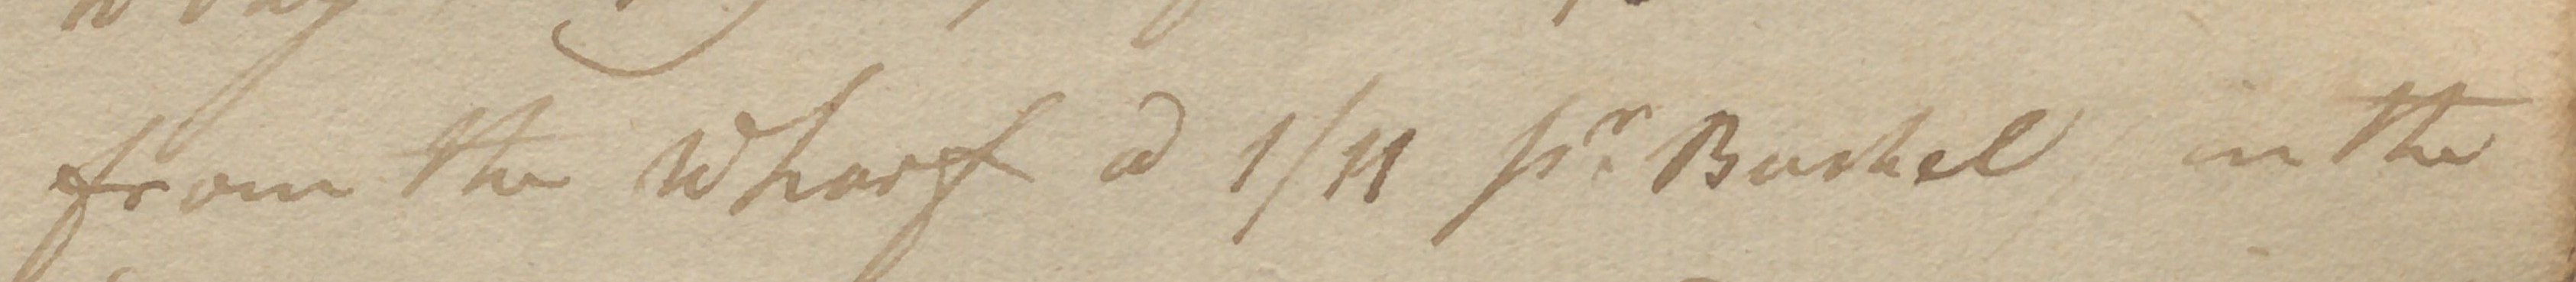from the wharf @ 1s 11 p^r. Bushel in the
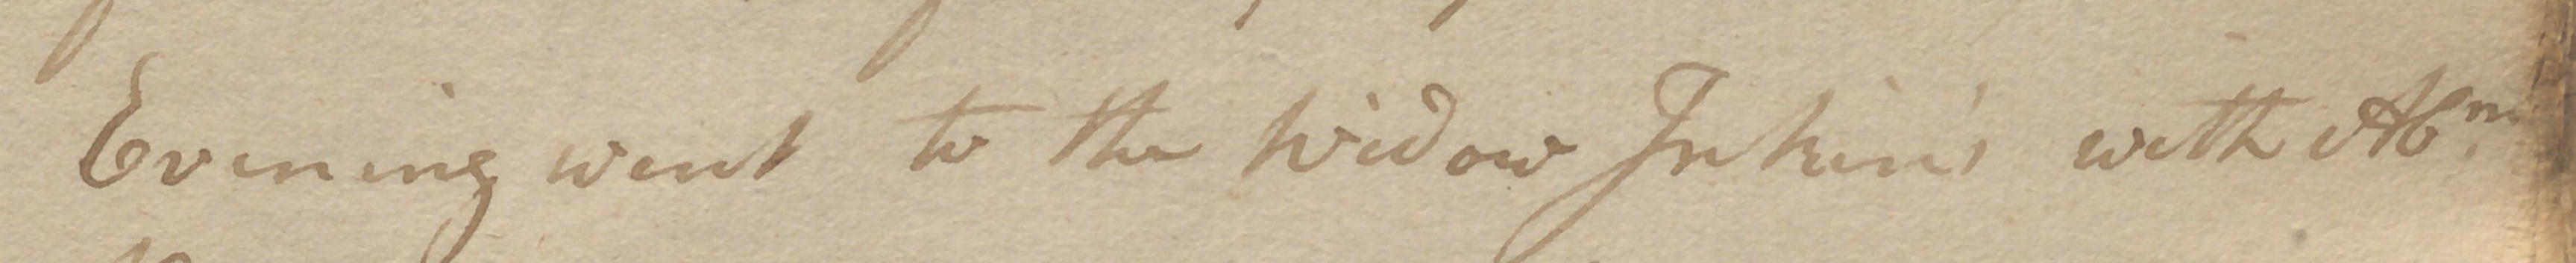Evening went to the Widow Inkins with Ab^m.
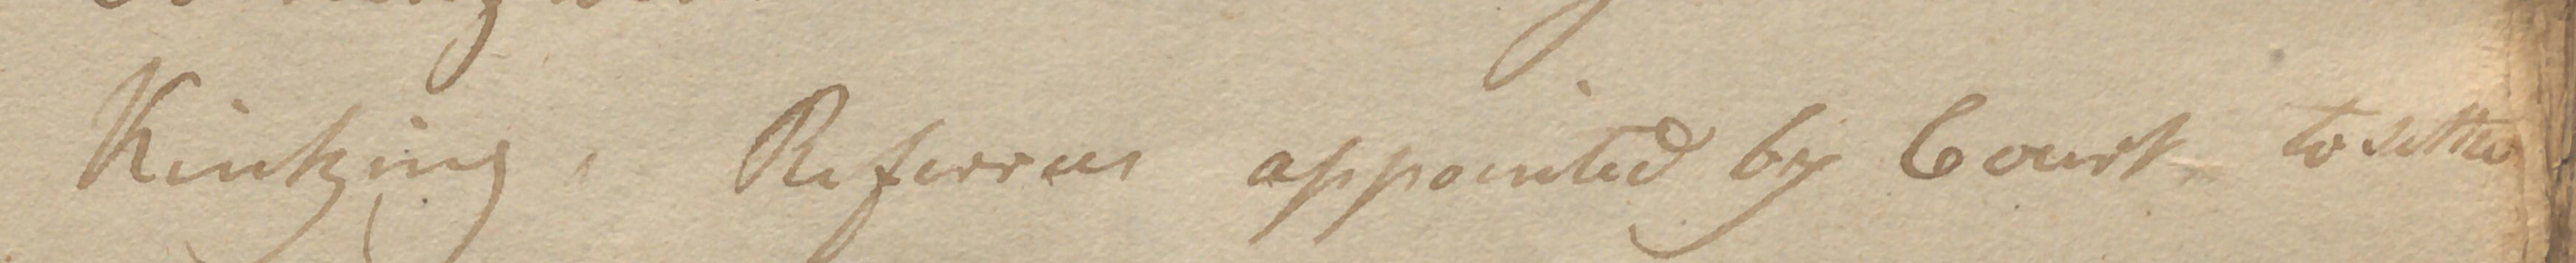Kintzing, Referrees appointed by Court to settle
